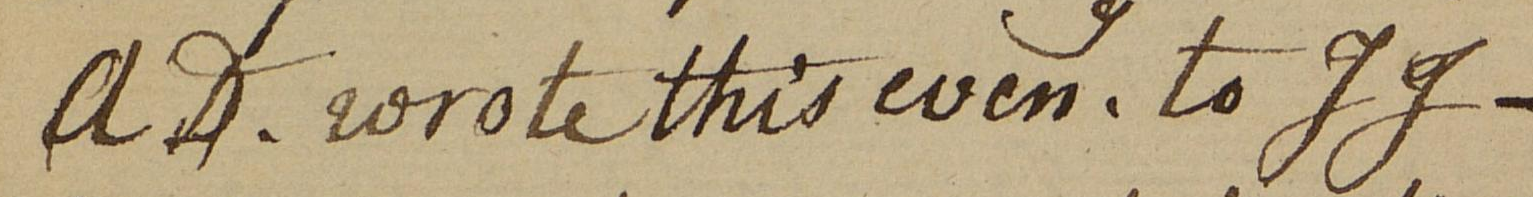AD. wrote this even^g. to JJ
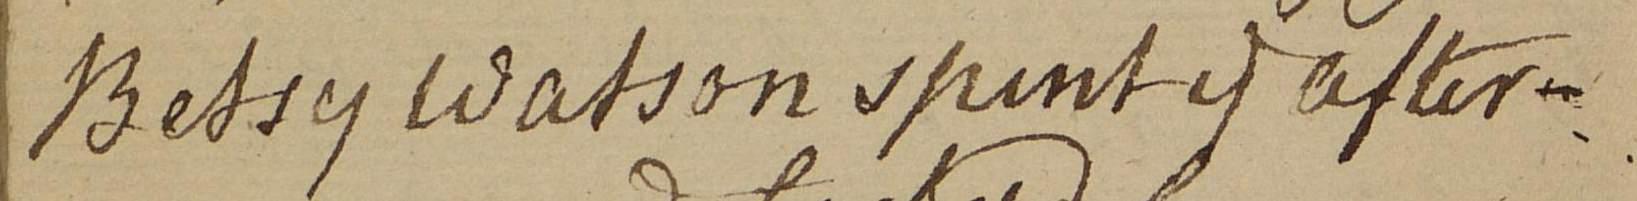Betsy Watson spent y^e after-
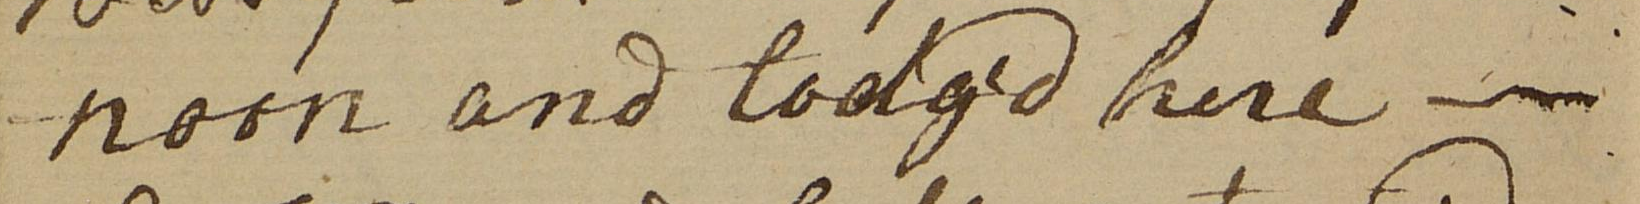-noon and lodg'd here-
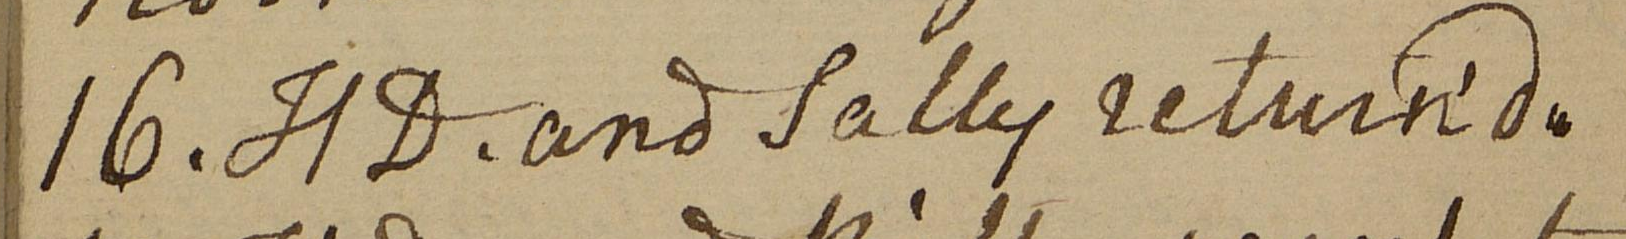16. HD. and Sally return'd.
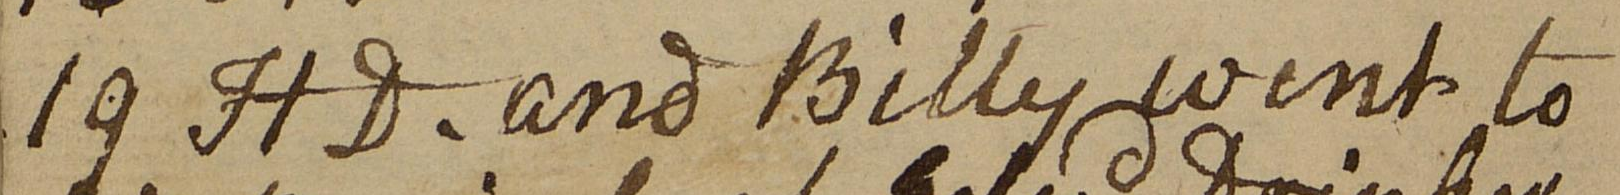19 HD and Billy went to
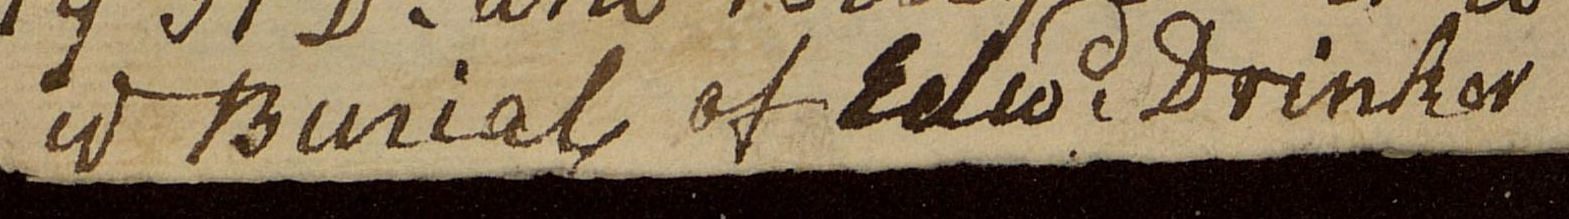y^e Burial, of Edw^d. Drinker
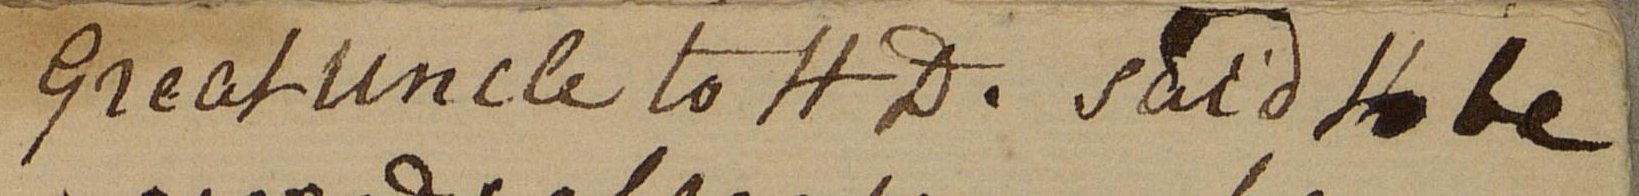Great Uncle to HD. said to be
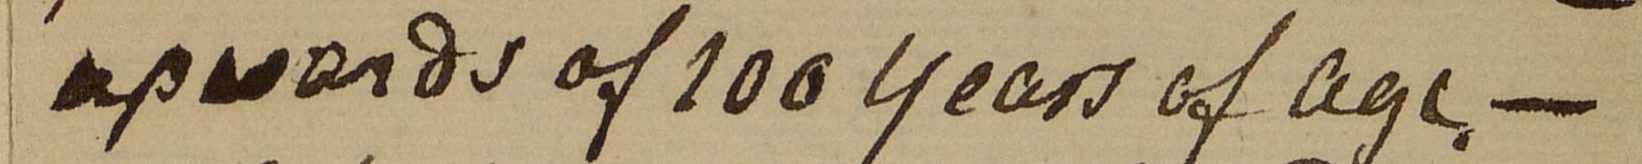upwards of 100 years of age-
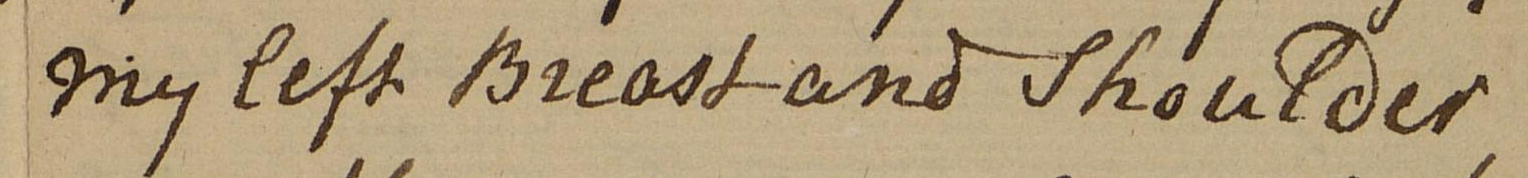my left Breast and Shoulder
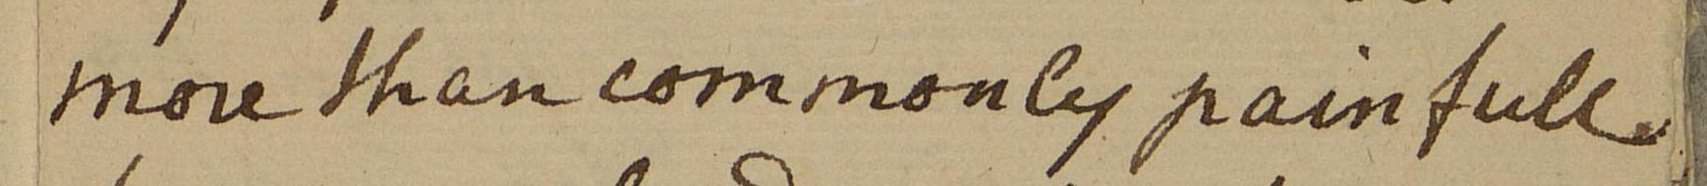more than commonly painfull
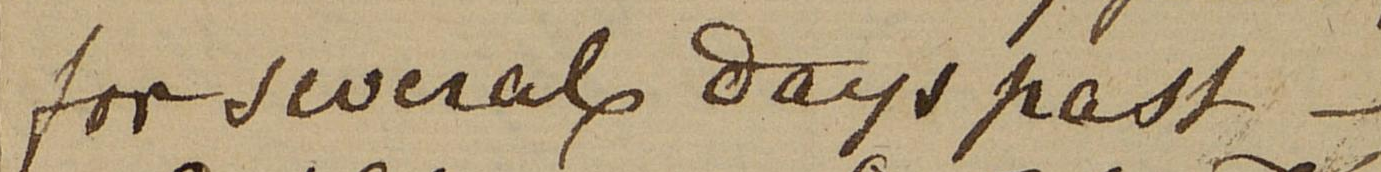for several days past-
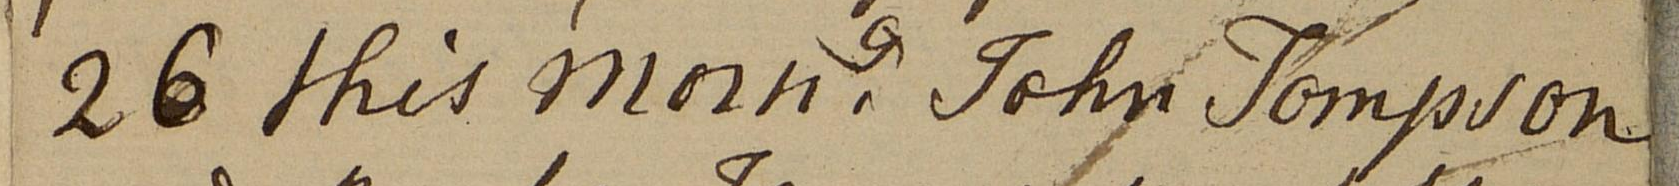26 this morn^g. John Tompson
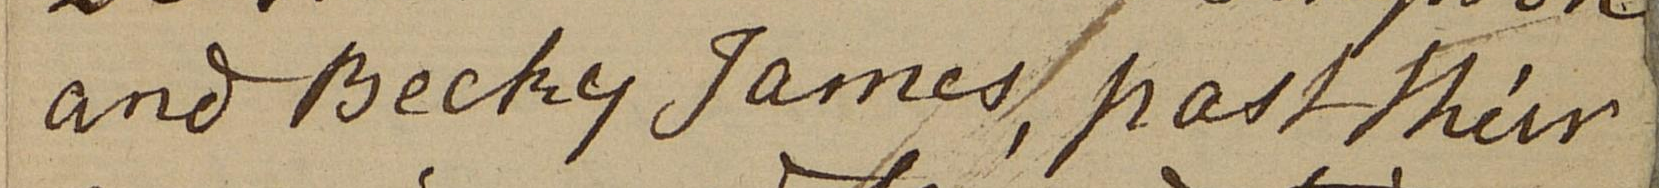and Becky James, past their
